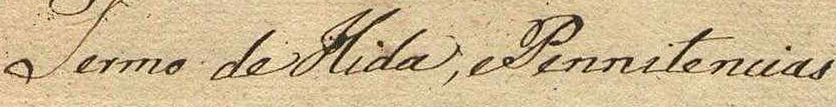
Termo de Hida, e Pennitencias
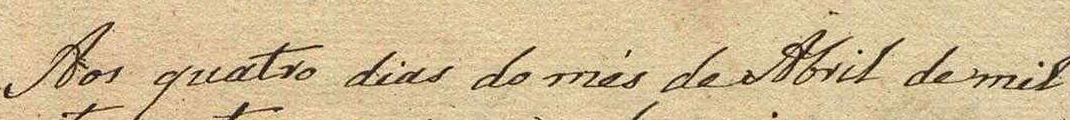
Aos quatro dias do més de Abril de mil
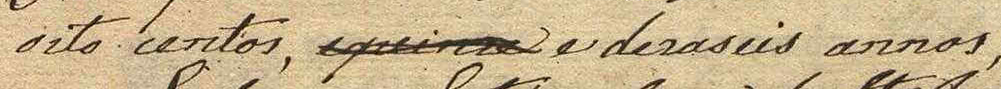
oito centos, e quinze e dezaseis annos,
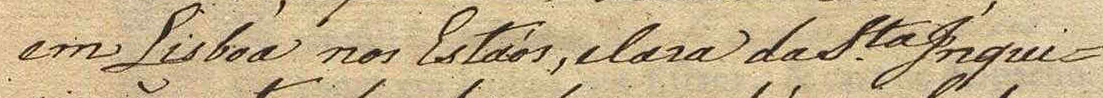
em Lisboa nos Estaõs, e Caza da S.ta Jnqui
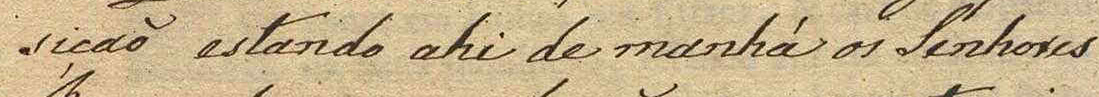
siçaõ estando ahi de manhã os Senhores
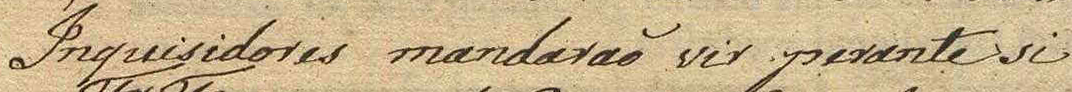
Inquisidores mandaraõ vir perante si
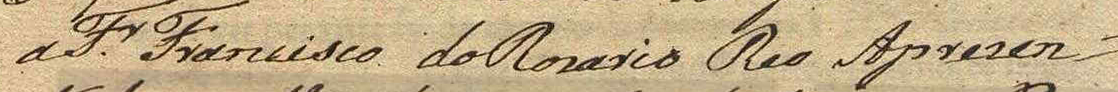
a Fr. Francisco do Rozario Reo Aprezen
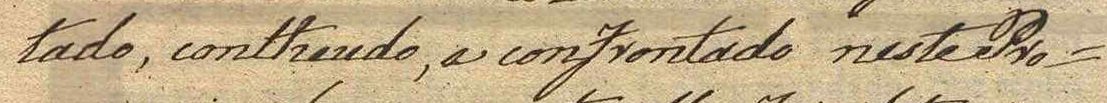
tado, contheudo, a confrontado neste Pro
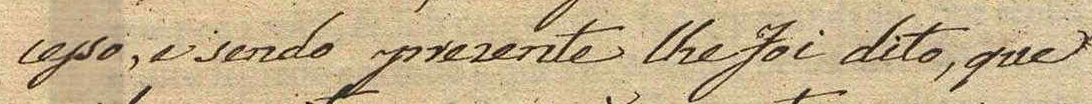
cesso, e sendo prezente lhe foi dito, que
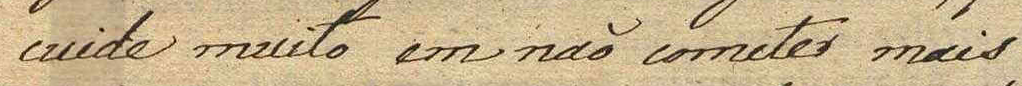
cuide muito em naõ cometer mais
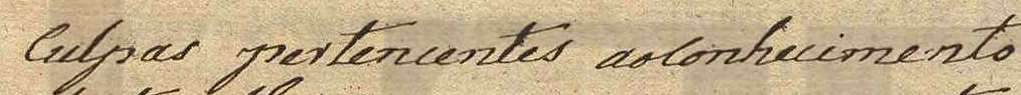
Culpas pertencentes ao conhecimento
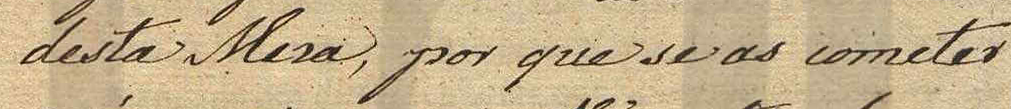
desta Meza, por que se as cometer
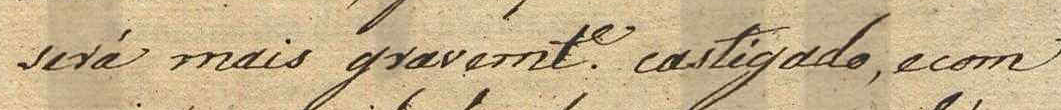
será mais gravemt.e castigado, e com
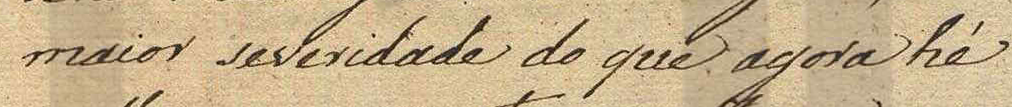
maior severidade do que agora hé
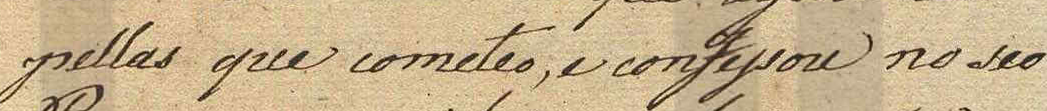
pellas que cometeo, e confessou no seo
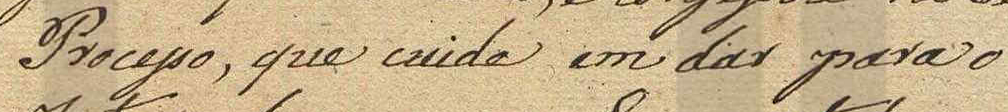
Processo, que cuide em dar para o
